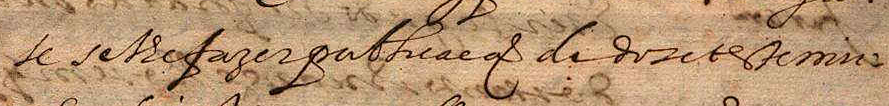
se se lhe fazer publicaçaõ de doze testemu
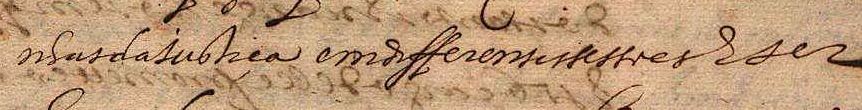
nhas da iustiça em differentes sessoes E ser
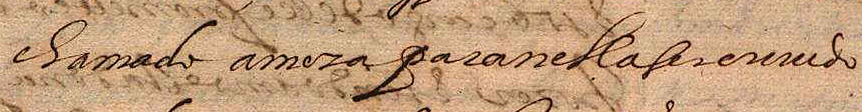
chamado a meza para nella ser ouuido
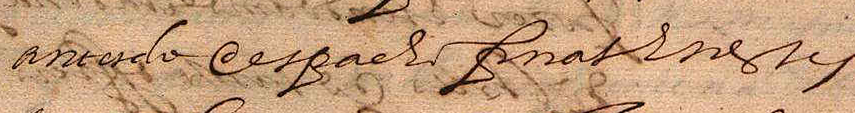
antes do despacho final E nestes
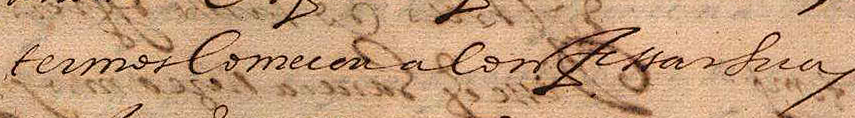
termos começou a confessar suas
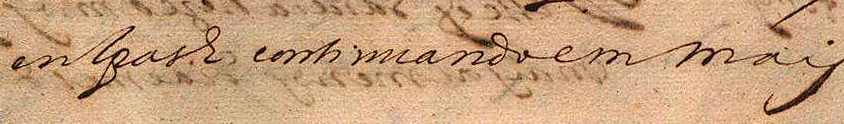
culpas E continuando em mais
